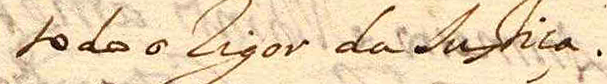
todo o Rigor da Iustiça.
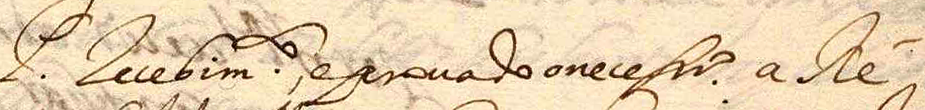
P. Recebim.to, e prouado o necessro. a Ré
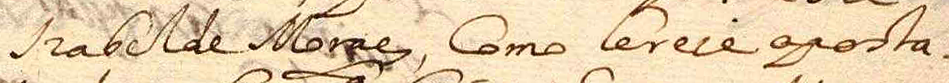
Izabel de Moraes, Como hereie aposta
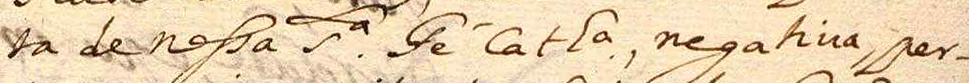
ta de nossa s.ta Fé Cath.a, negatiua, per
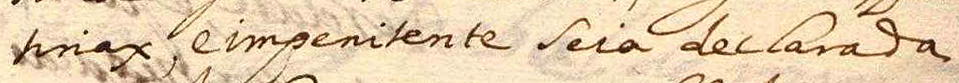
tinax, e impenitente seia declarada
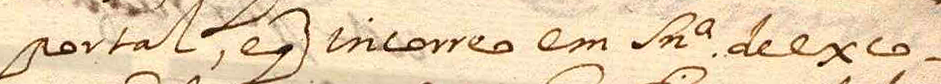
por tal, e q̄ incorreo em sn.a de exco
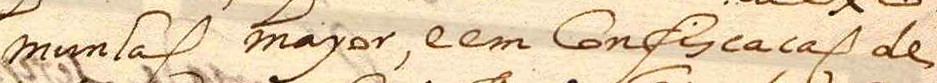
munhaõ mayor, e em Confiscaçaõ de
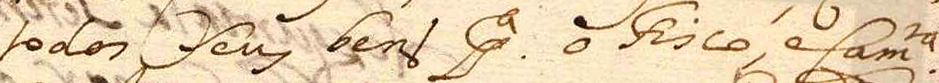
todos seus bens p.a o Fisco, e Cam.ra
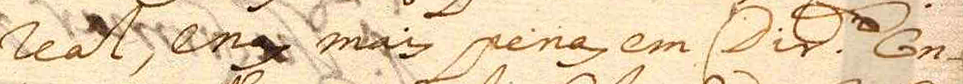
Real, e nas mais penas em Dir.to Con
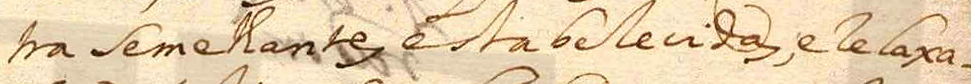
tra semelhantes estabelecidas; e Relaxa
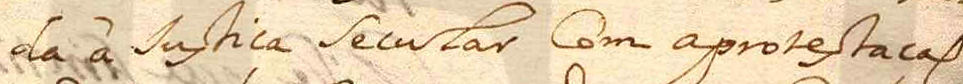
da à Iustiça Secular Com a protestaçaõ
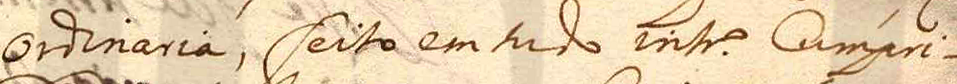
ordinaria, feito em tudo intr.o Cumpri
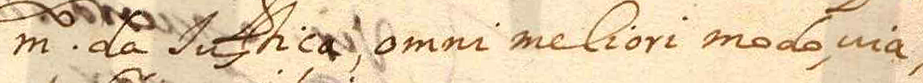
m.to da Iustiça, omni meliori modo, uia,
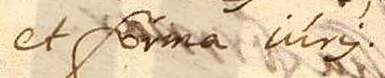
et fórma iuris.
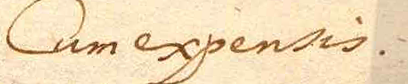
Cum expensis.
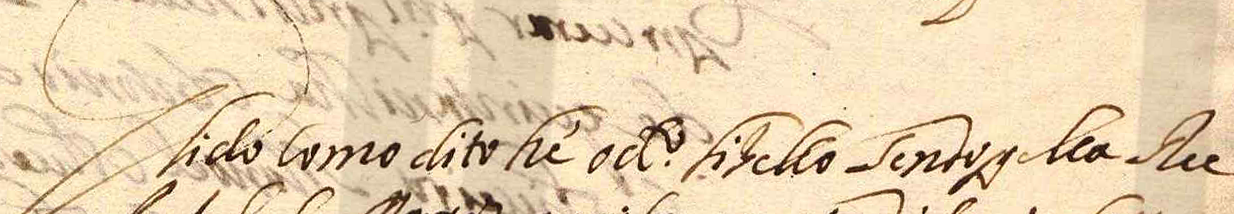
E lido como dito hé o d̄.o libello sendo pella Ree
